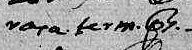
rasa. term. p̄.
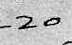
20
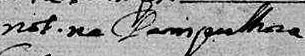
not. na Pampilhoza
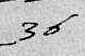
36
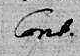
Cont.
